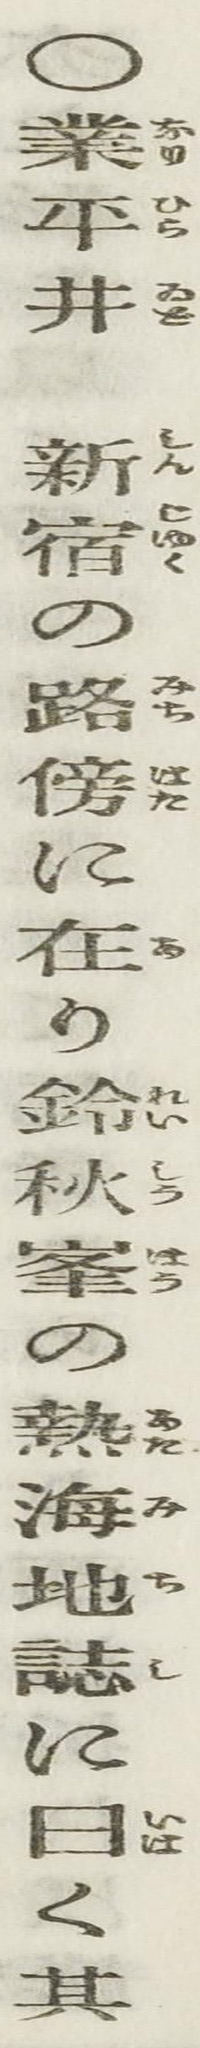○業平井新宿の路傍に在り鈴秋峯の熱海地誌に曰く其
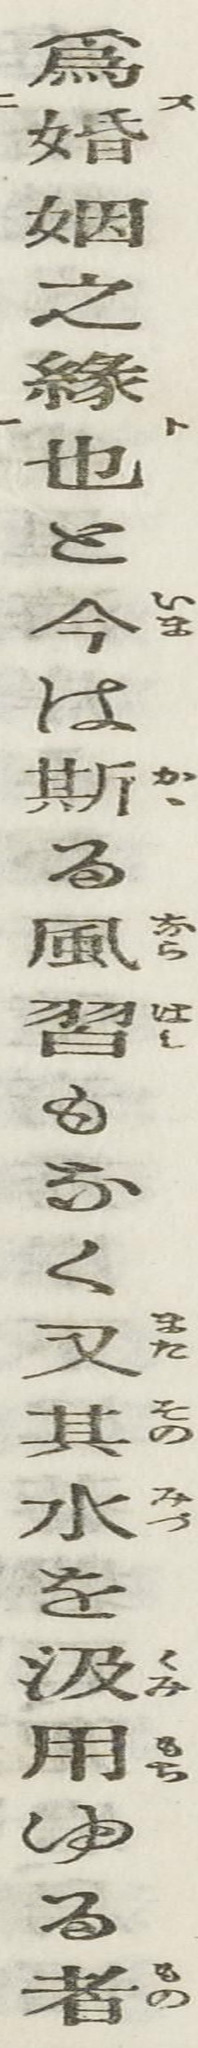爲婚姻之縁也と今は斯る風習もなく又其水を汲用ゆる者
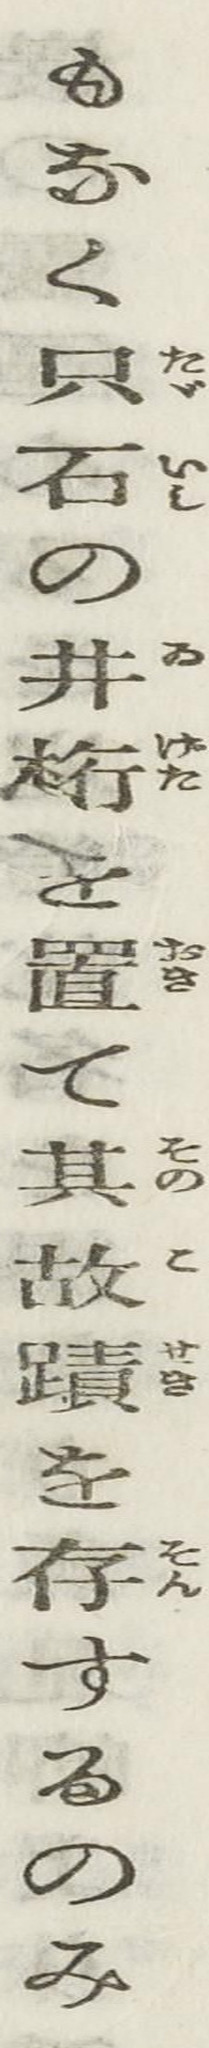もなく只石の井桁を置て其故蹟を存するのみ
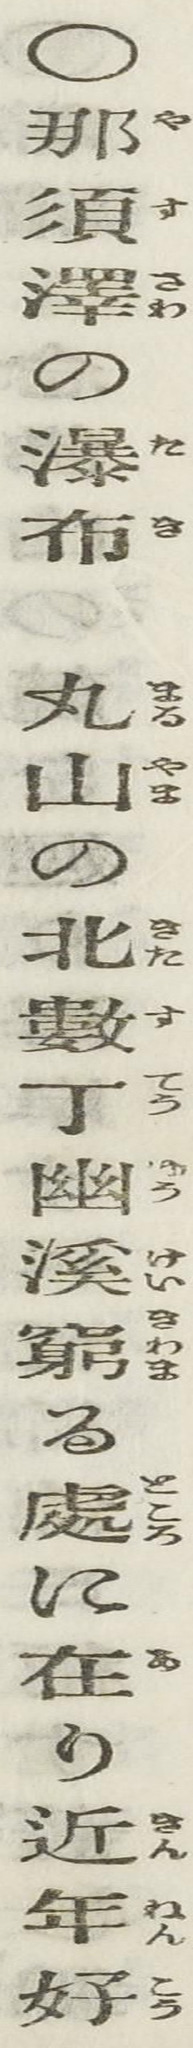○那須澤の瀑布丸山の北数丁幽溪窮る處に在り近年好
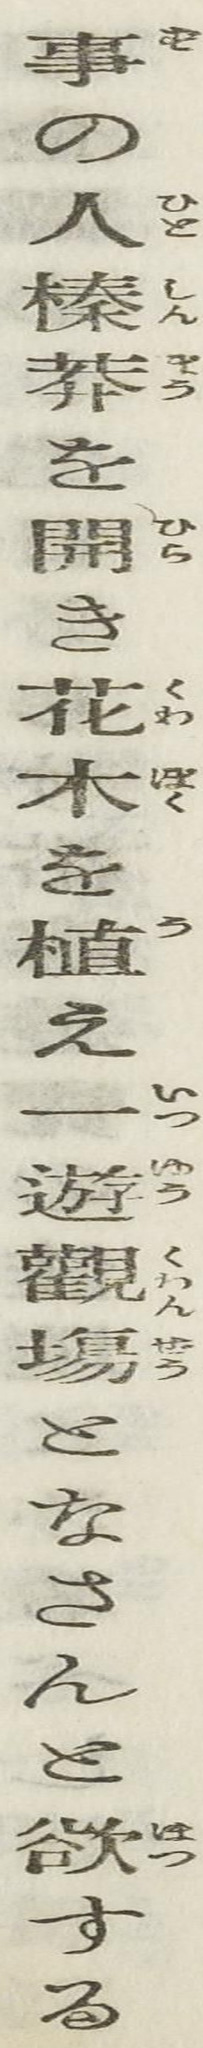事の人榛莽を開き花木を植え一遊観場となさんと欲する

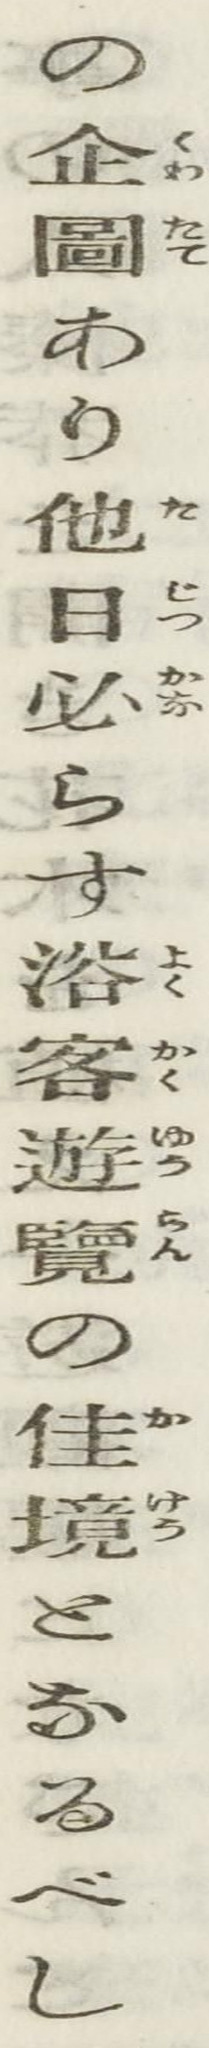の企画あり他日必らす浴客遊覧の佳境となるべし
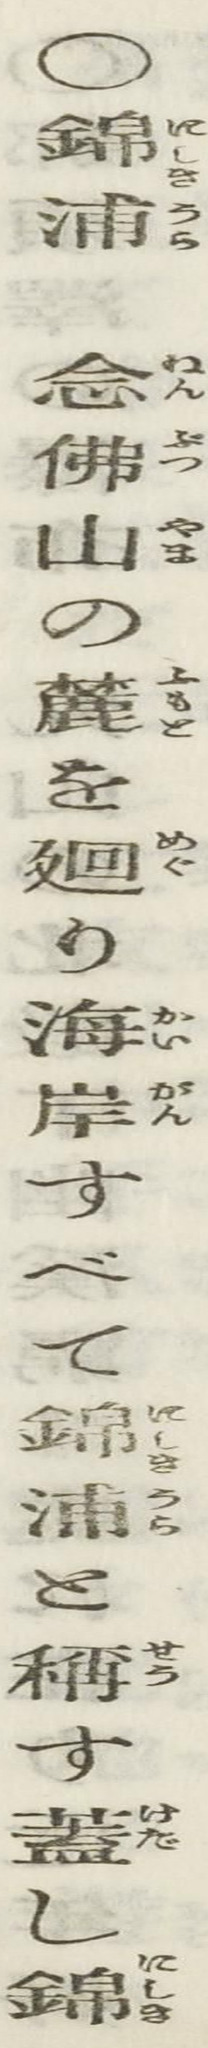○錦浦念佛山の麓を廻り海岸すべて錦浦と称す蓋し錦
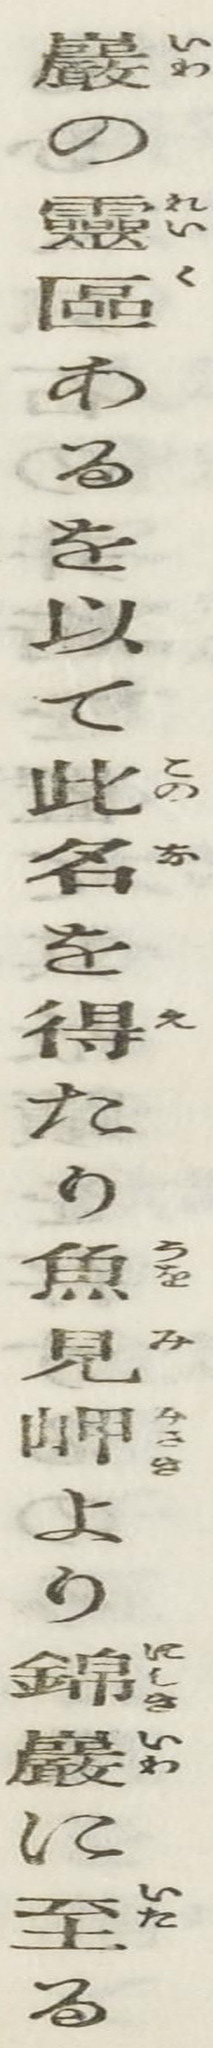巖の霊区あるを以て此名を得たり魚見岬より錦巌に至る
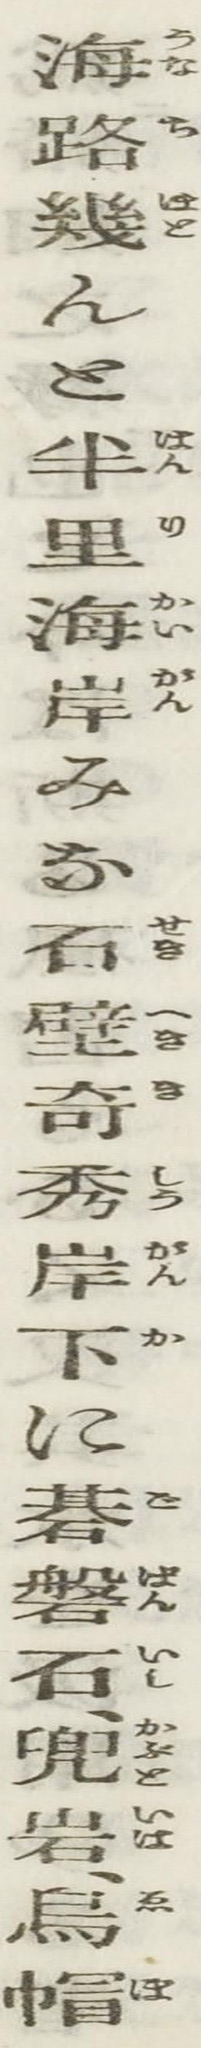海路幾んと半里海岸みな石壁奇秀岸下に碁盤石、兜岩、烏帽
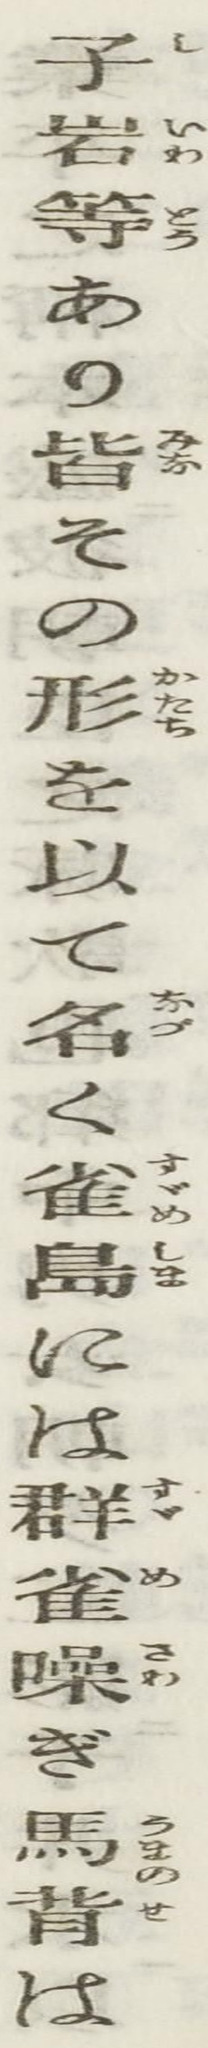子岩等あり皆その形を以て名く雀島には群雀噪ぎ馬背は
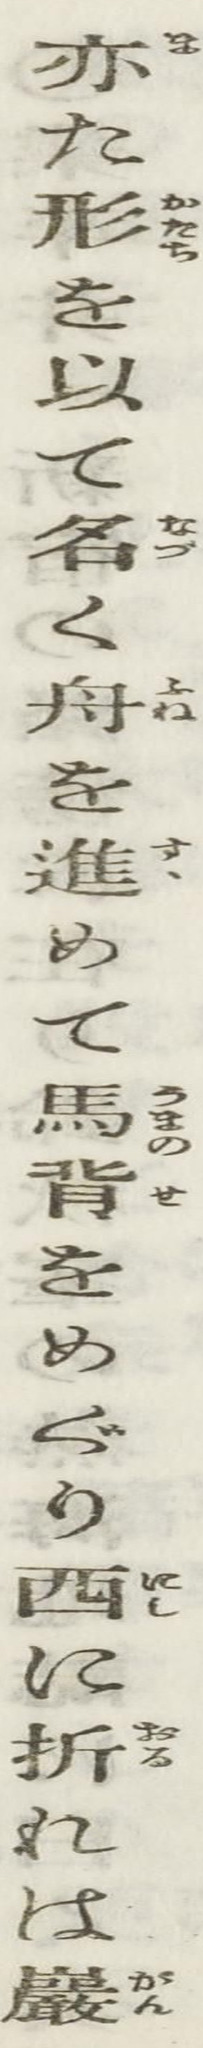亦た形を以て名く舟を進めて馬背をめぐり西に折れは巖
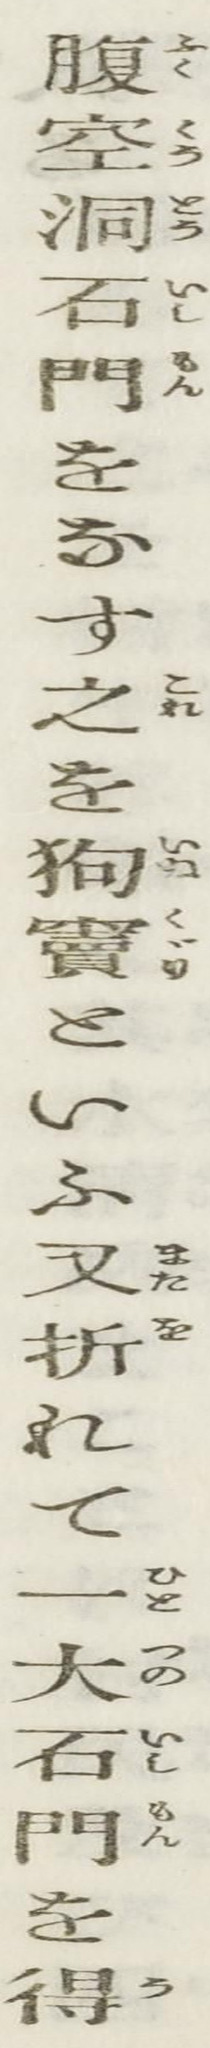腹空洞石門をなす之を狗竇といふ又折れて一大石門を得
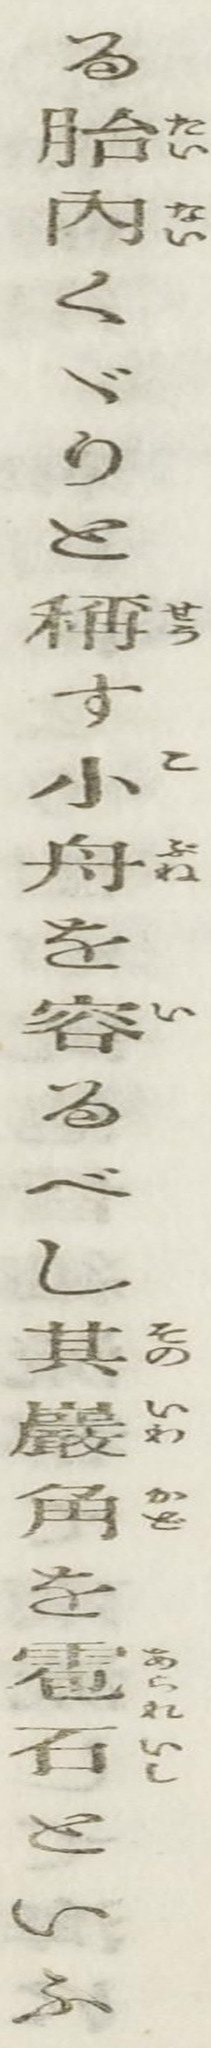る胎内くゞりと称す小舟を容るべし其巖角を雹石といふ
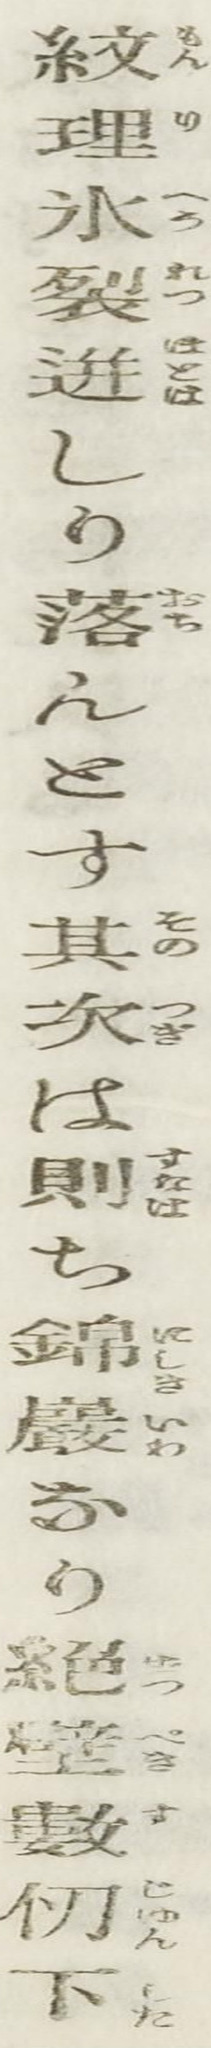紋理氷裂迸しり落んとす其次は則ち錦巌なり絶壁数仞下
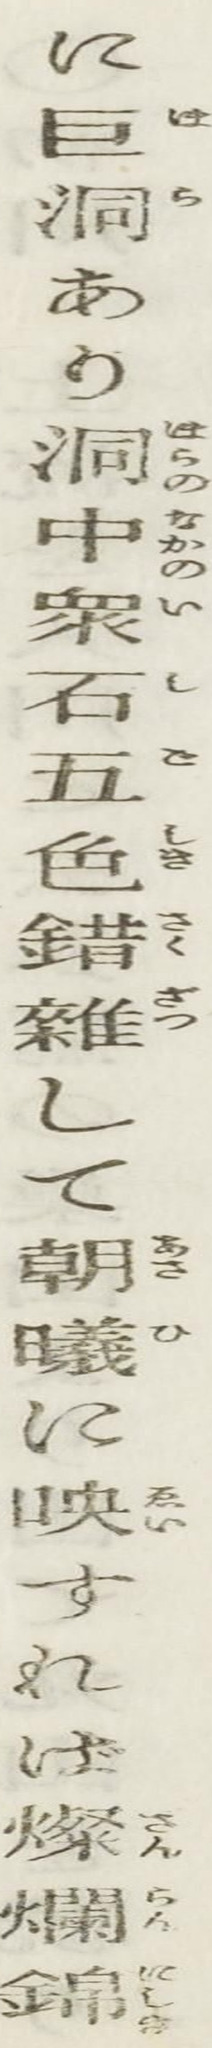に巨洞あり洞中衆石五色錯雑して朝曦に映すれば燦爛錦
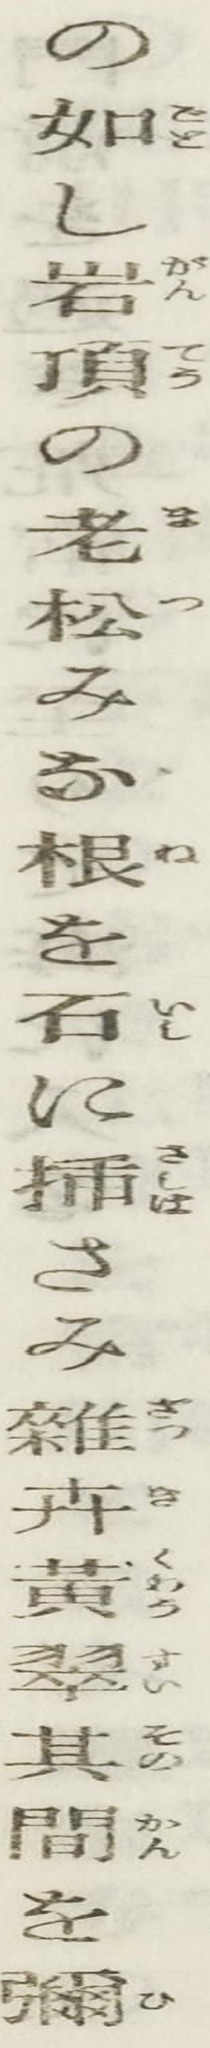の如し岩頂の老松みな根を石に挿さみ雑卉黄翠其間を彌
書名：熱海獨案内　全
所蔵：東京大学地震研究所図書室 Earthquake Research Institute Library, The University of Tokyo, JAPAN
